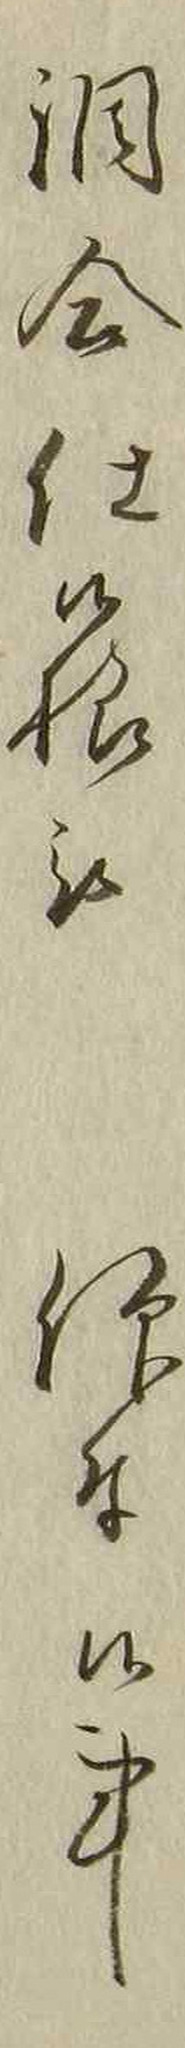調合仕候様被仰付候事
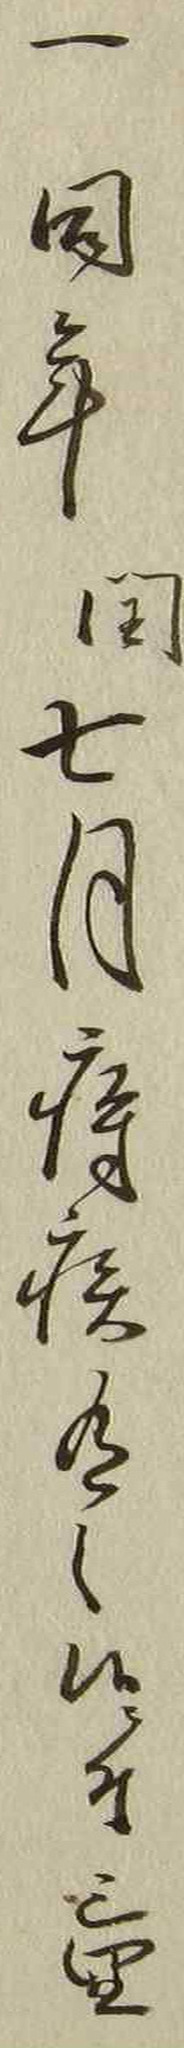一同年閏七月痔疾有之候ニ付三里
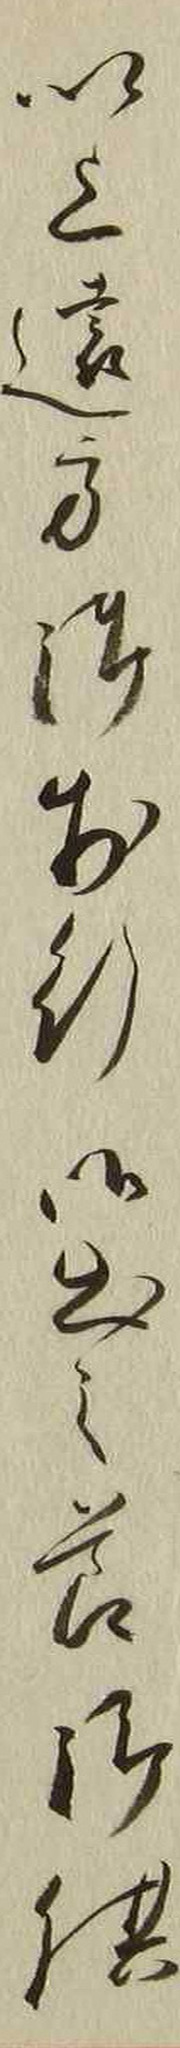以上遠方御歩行御出之節御供
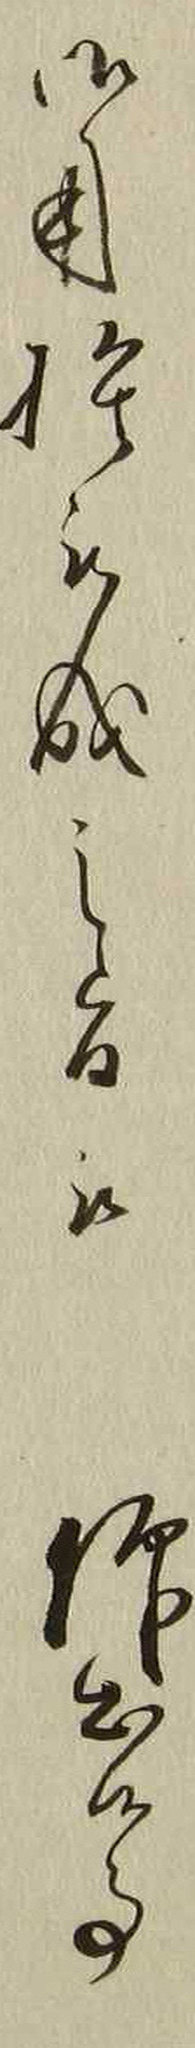御用捨被成之旨被仰出候事
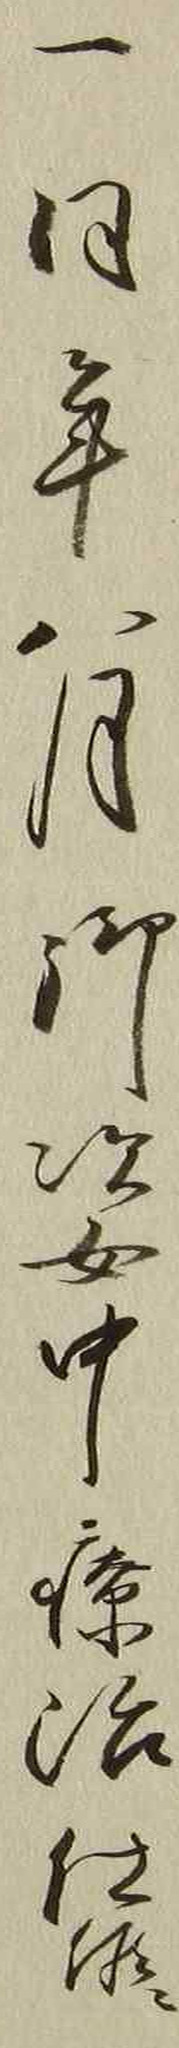一同年八月御次女中療治仕候ニ
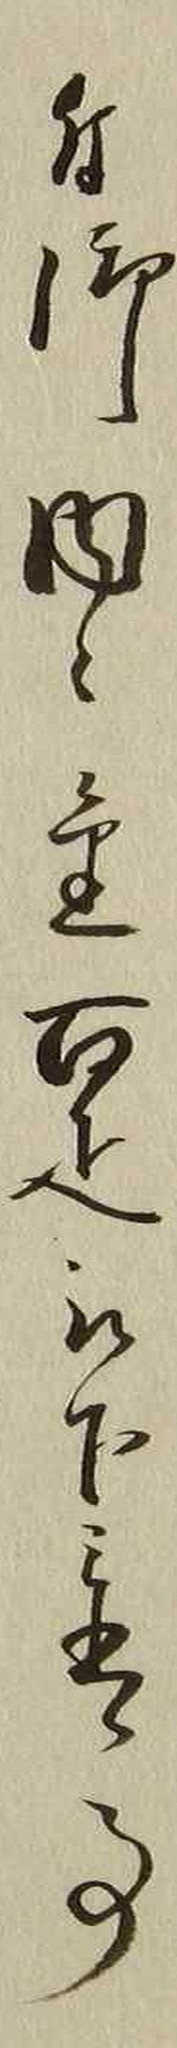付御内々金百疋被下置候事
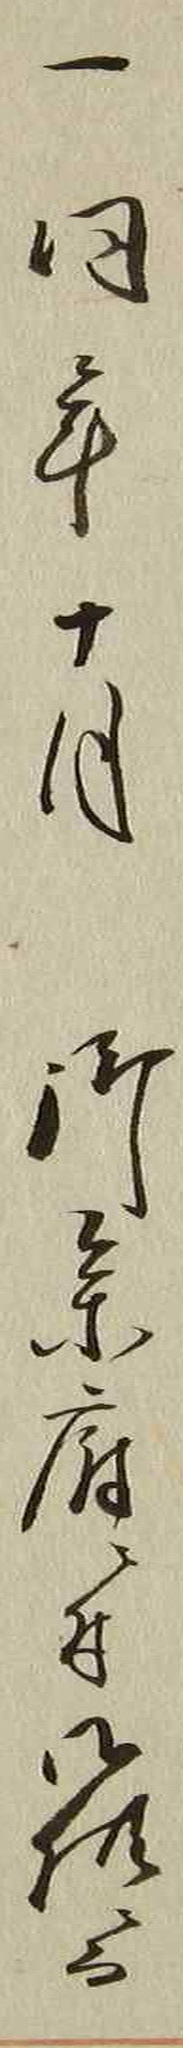一同年十月御参府ニ付御供ニ而
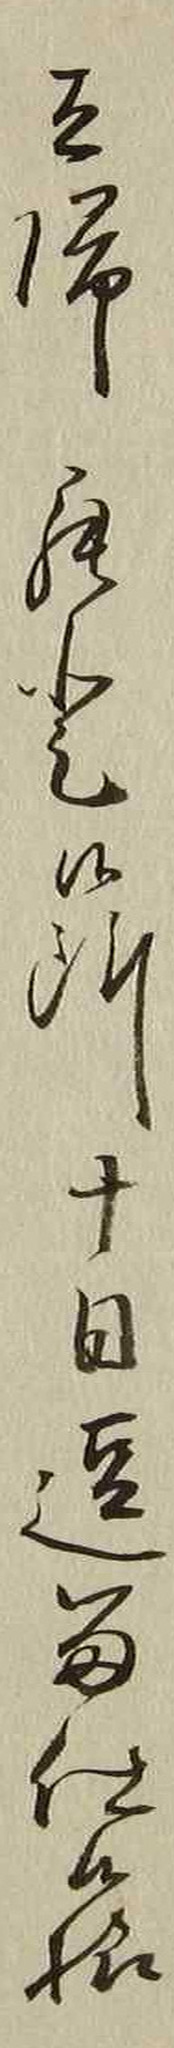立帰罷登候所十日逗留仕候様
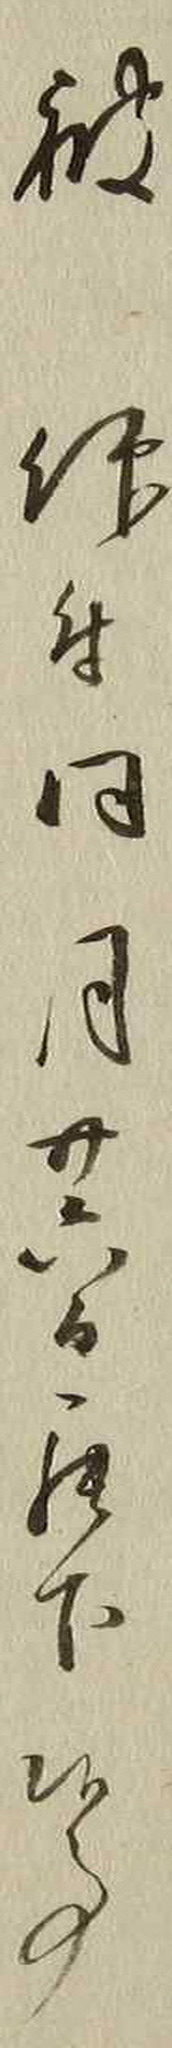被仰付同月廿六日罷下候事
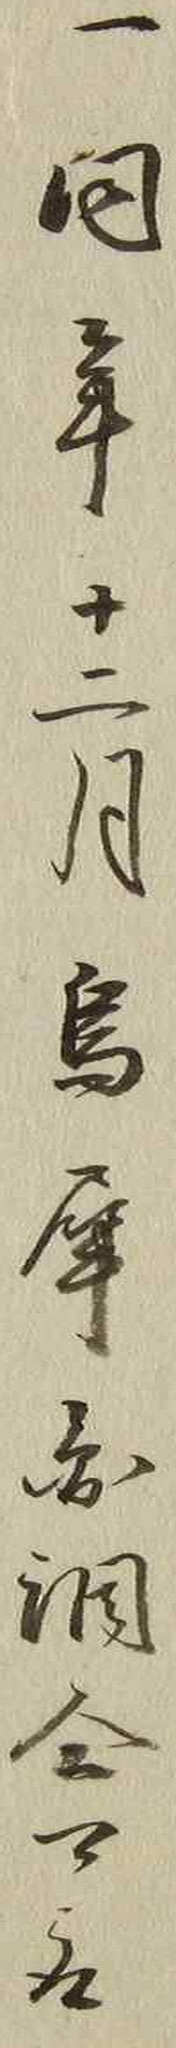一同年十二月烏犀赤調合可取
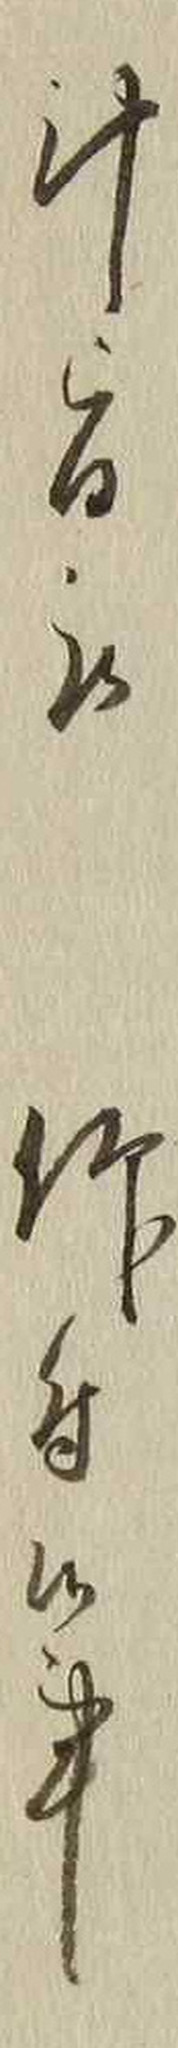計旨被仰付候事
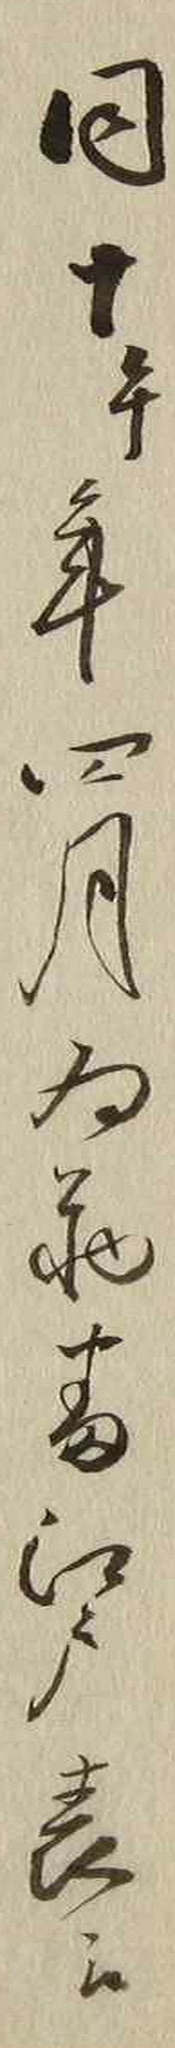同十午年四月為勤番江戸表江
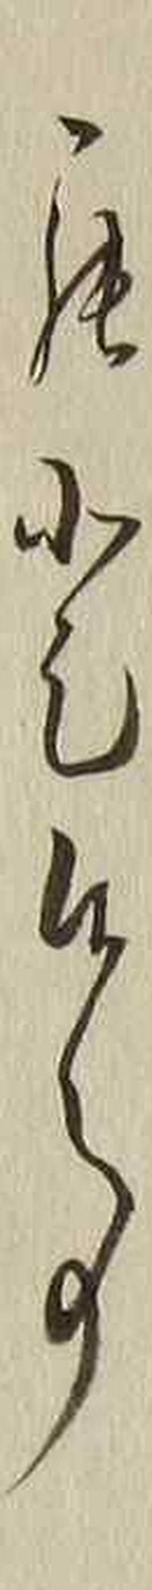罷登候事
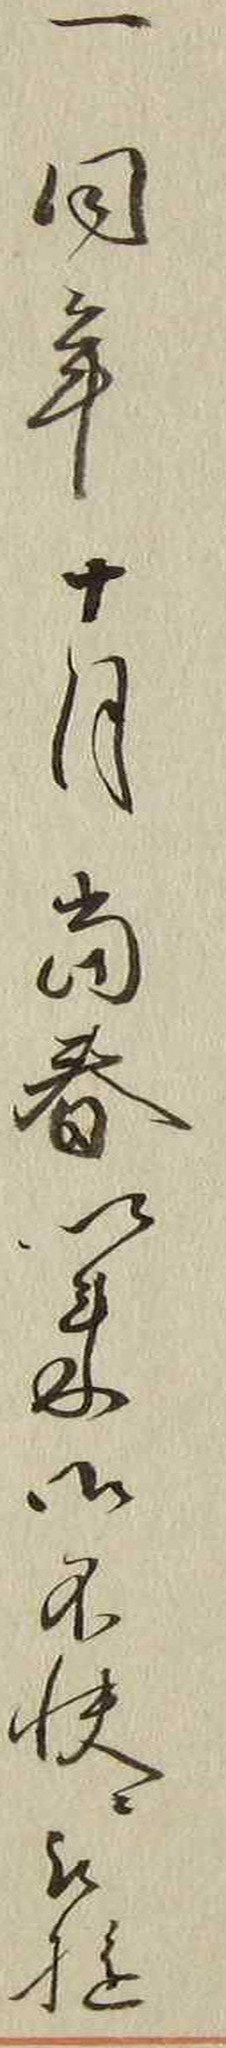一同年十月当春以来御不快ニ被遊
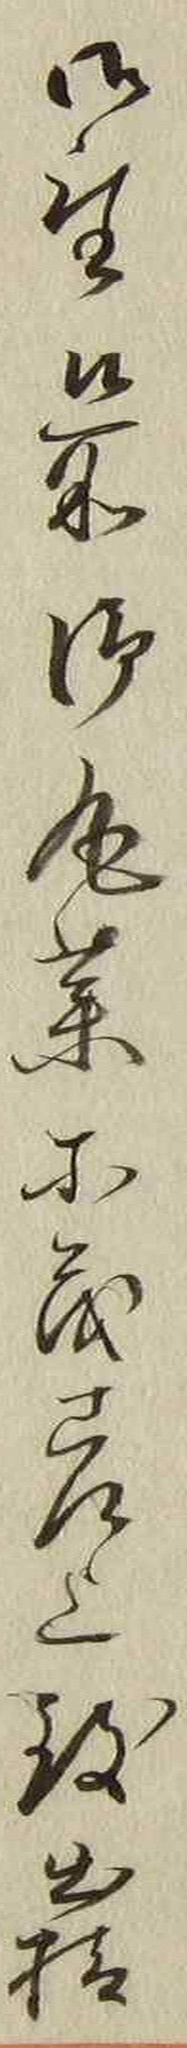御成候所御丸薬等も差上致出精
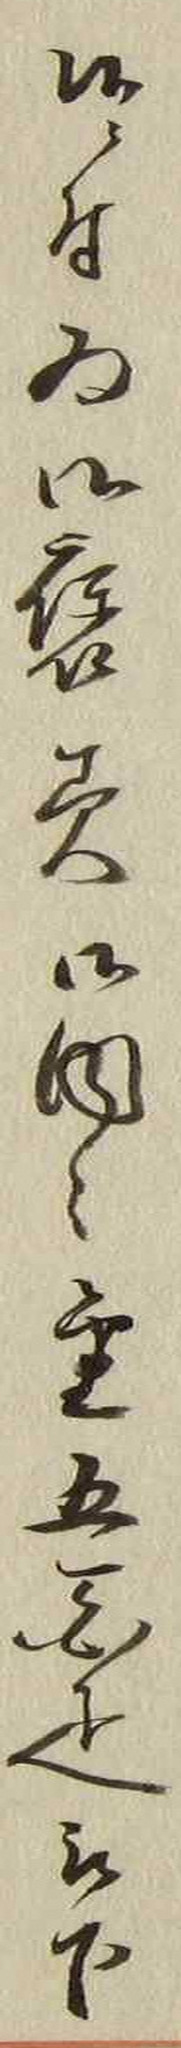候ニ付為御褒美御内々金五百疋被下
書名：諸士系譜　巻之68　を之部2
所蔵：会津若松市立会津図書館
